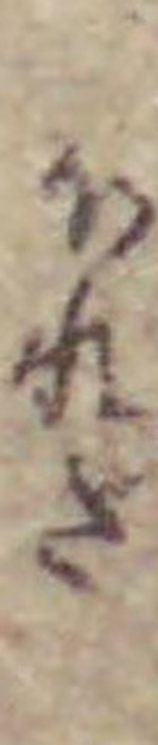ほれだ
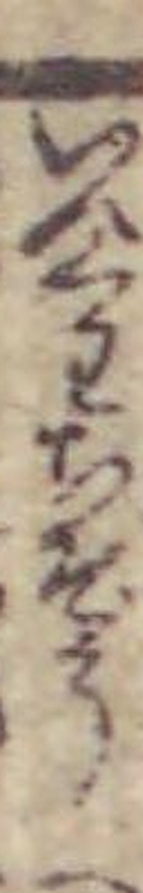いんぐわちぞう
